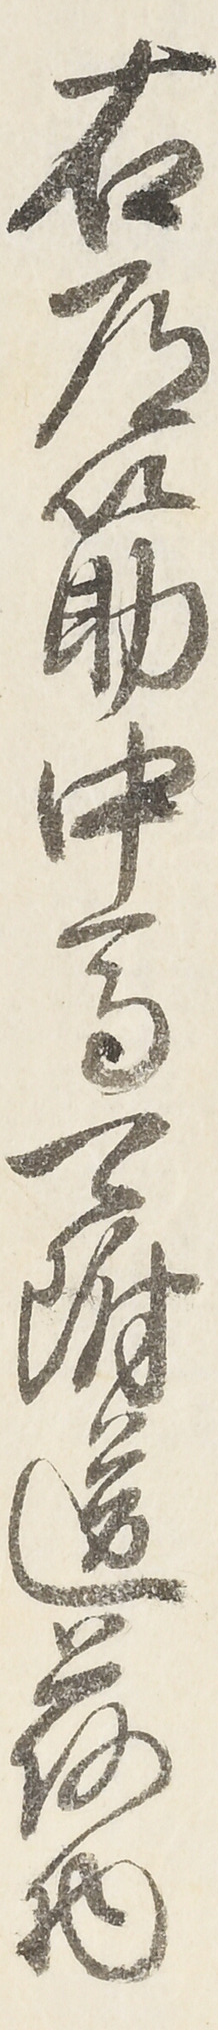右道筋中馬可附送荷物
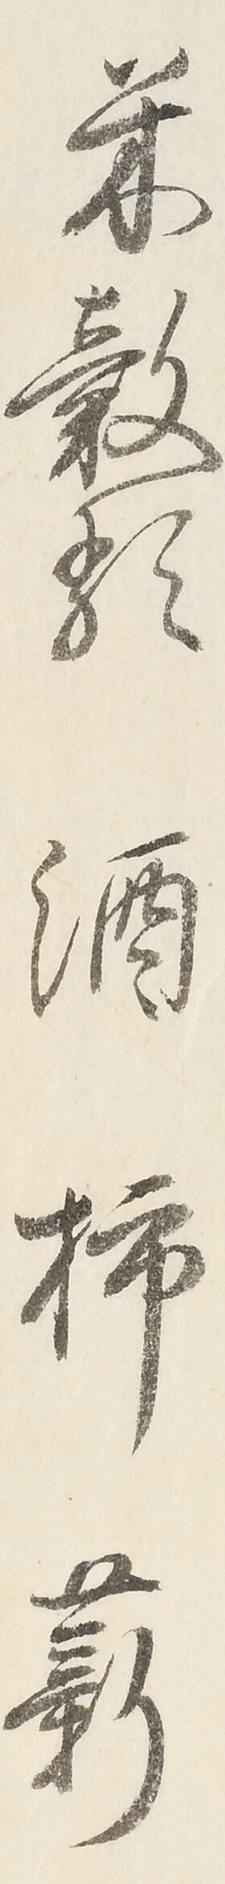米穀類酒柿薪
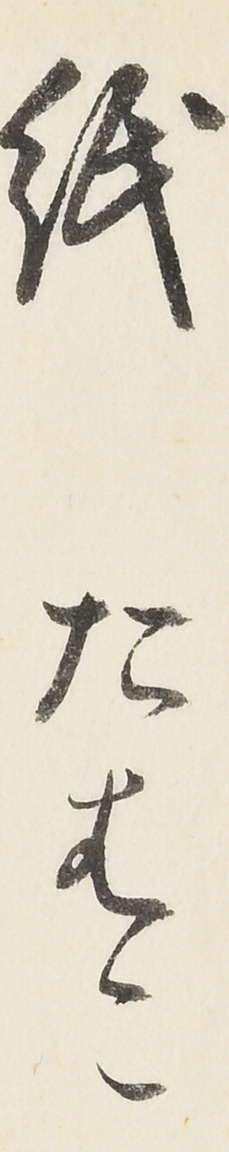紙たはこ
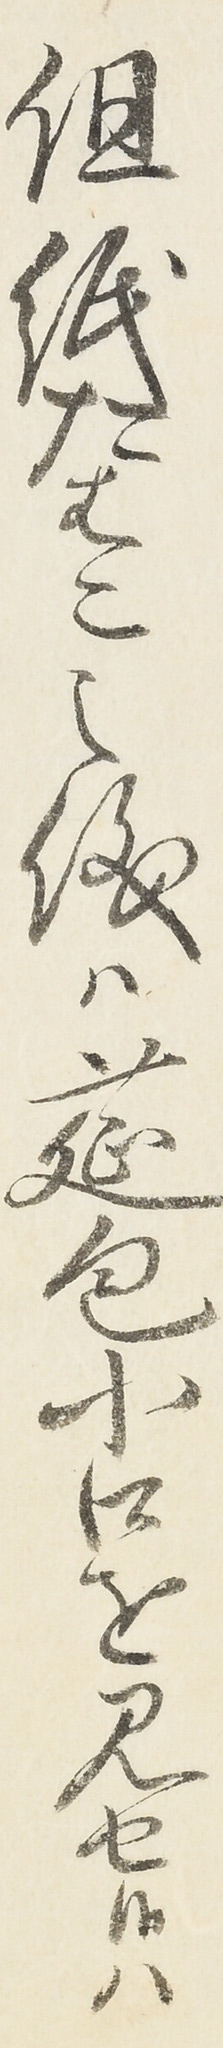但紙たはこ之儀ハ莚包小口を見せ候ハ
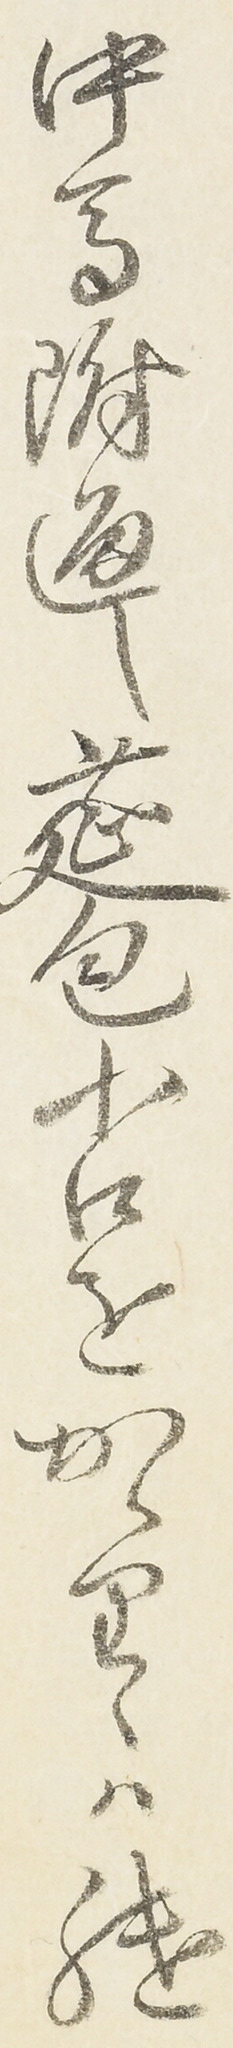中馬附通し莚包小口をかゝり候ハ継
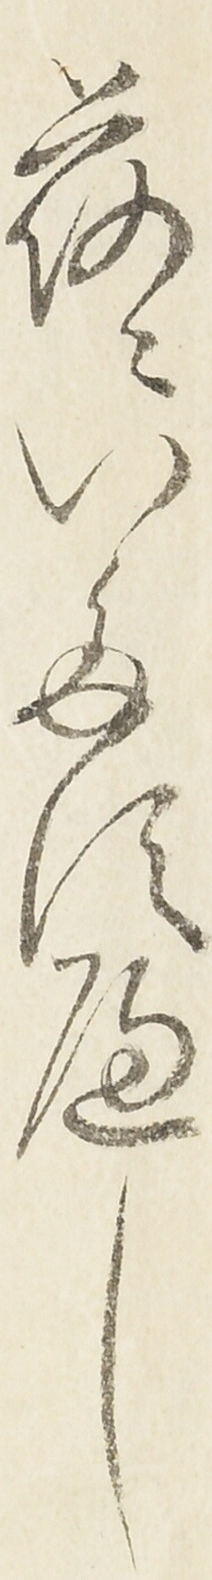荷ニいたすへし
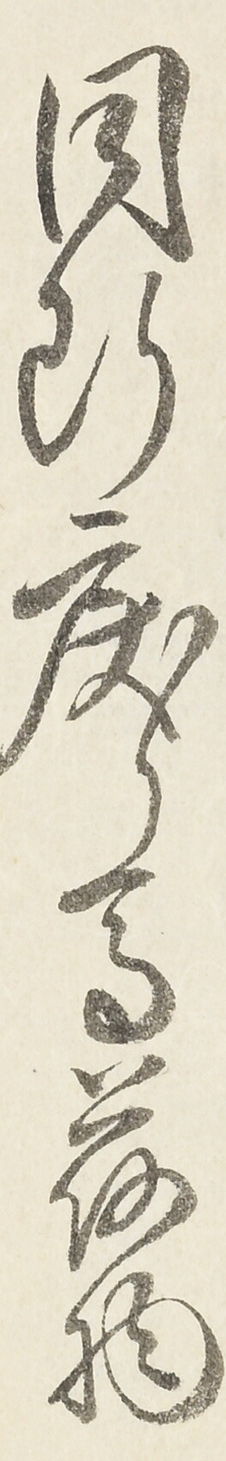同断戻り馬荷物
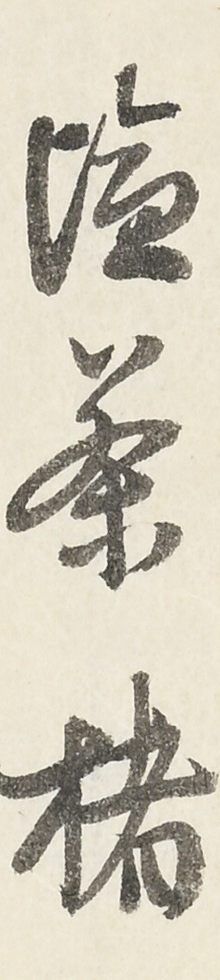塩茶楮
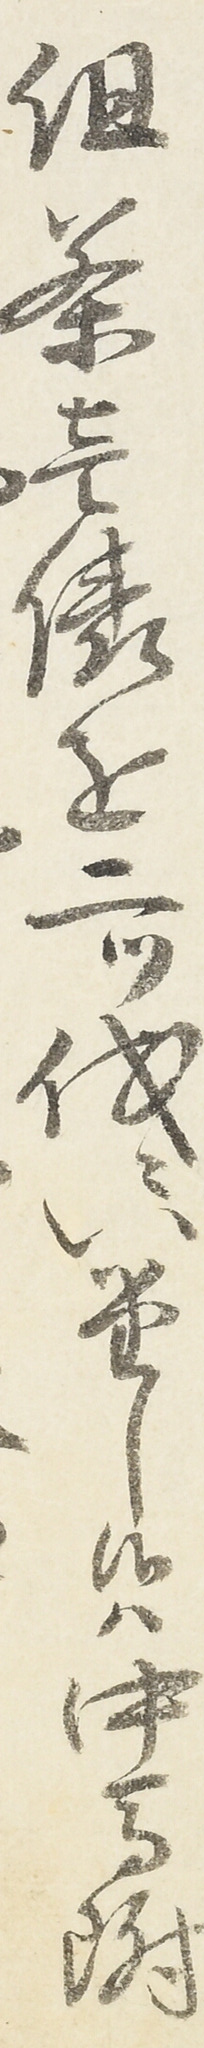但茶壱俵を二ツ伐ニいたし候ハ中馬附
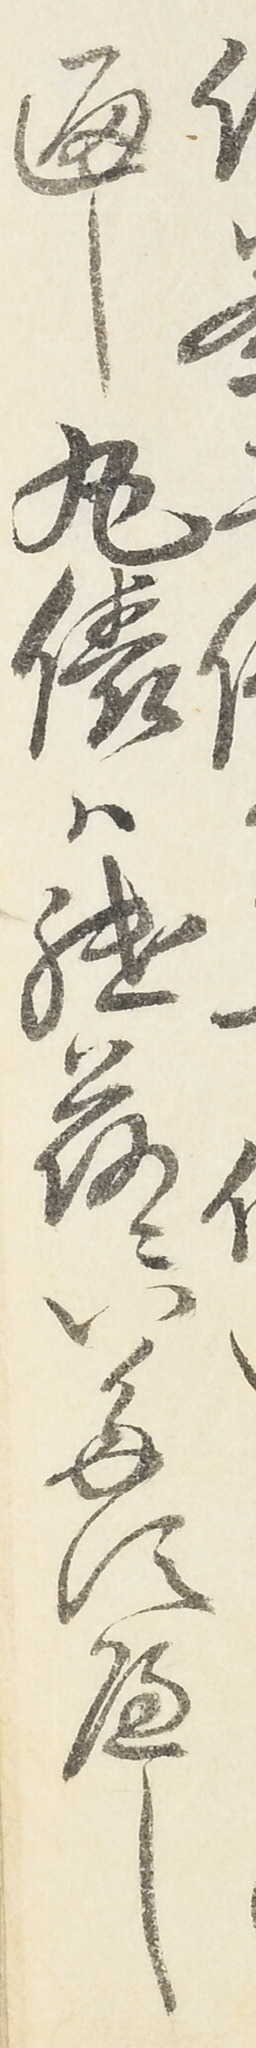通し九俵ハ継落ニいたすへし

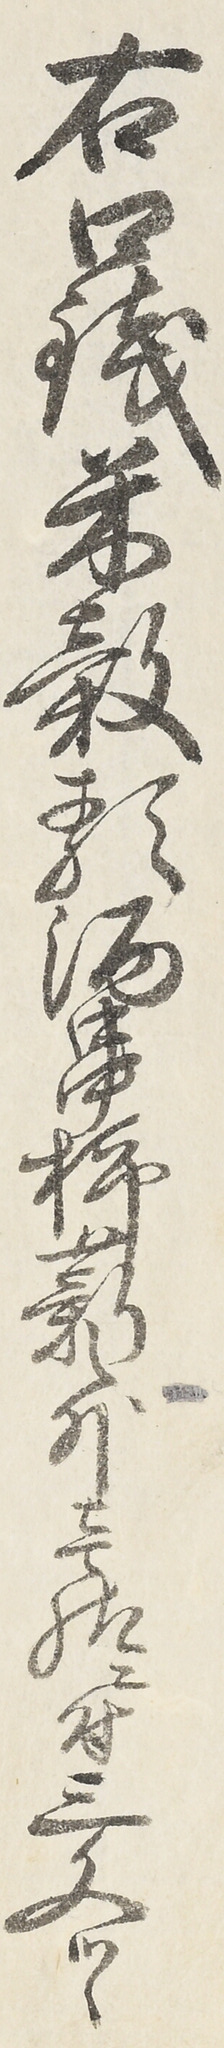右口銭米穀類酒串柿薪外壱駄ニ付三文ツヽ
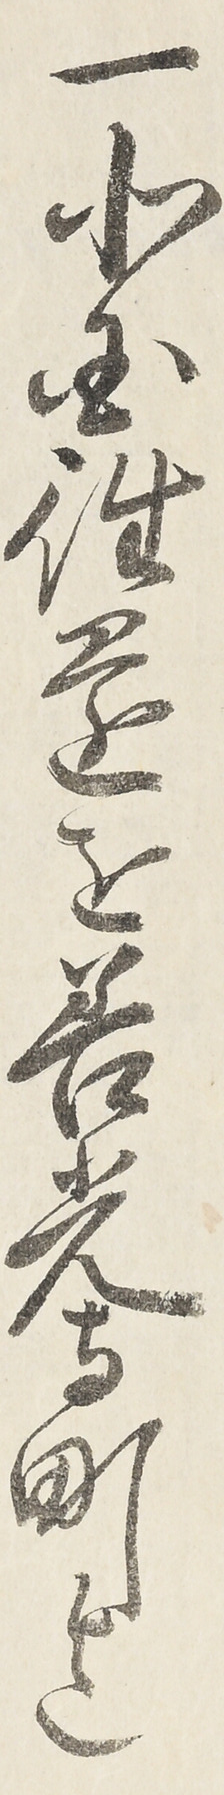一北国往還を善光町迄
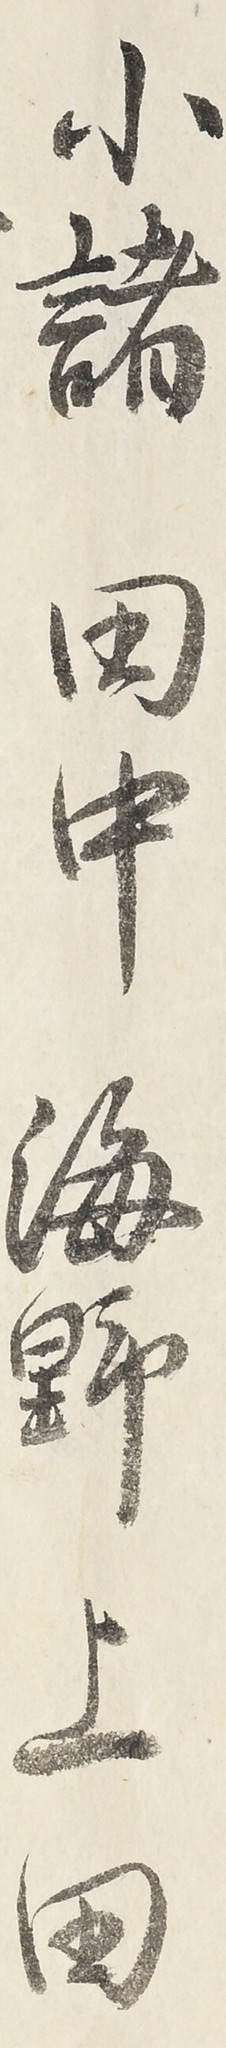小諸田中海野上田
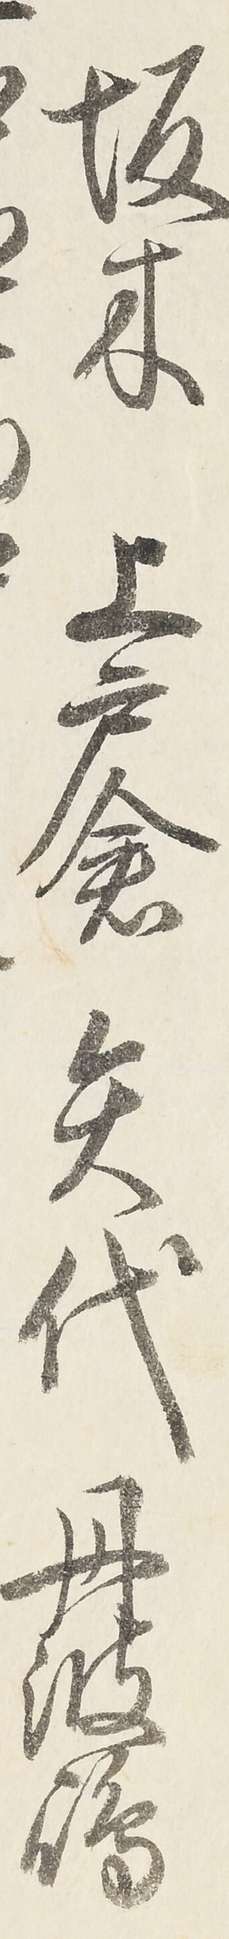坂木上戸倉矢代丹波嶋
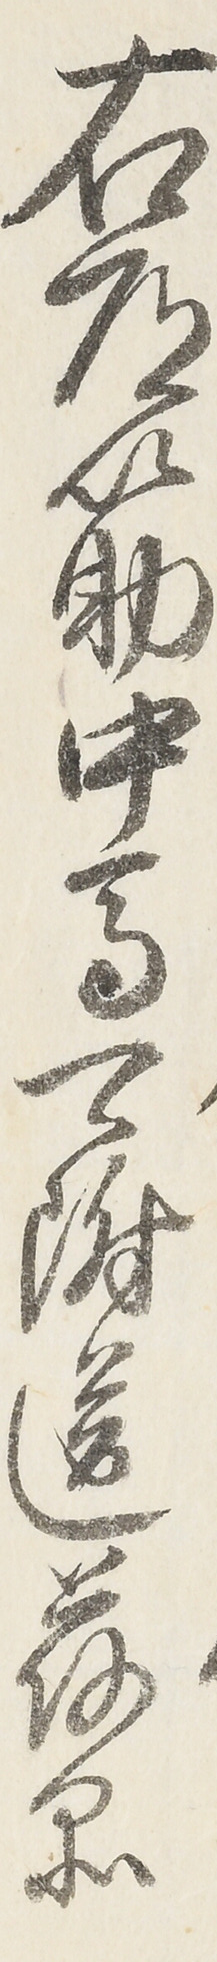右道筋中馬可附送荷品
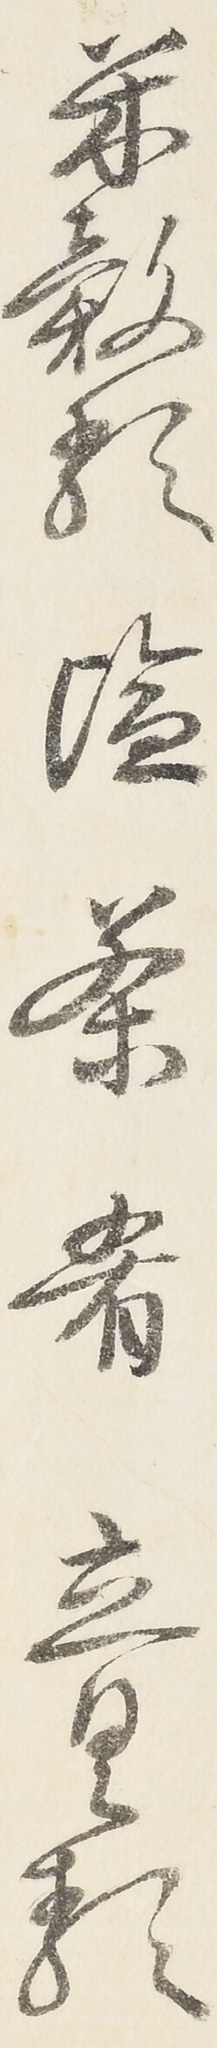米穀類塩茶肴立具類
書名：中馬御裁許帳面
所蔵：伊那市立高遠町図書館・合同会社AMANE
